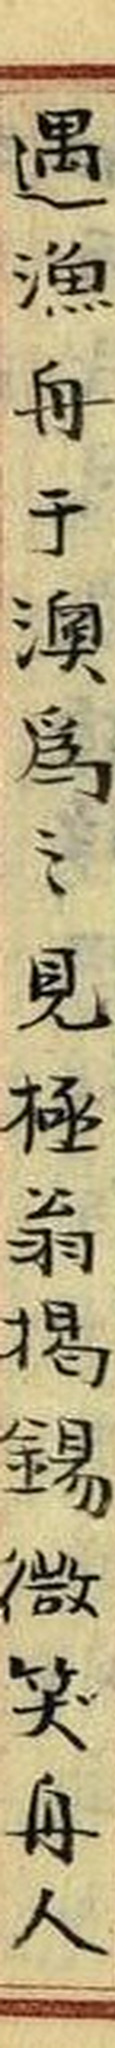遇漁舟于澳爲之見極翁掲錫微笑舟人
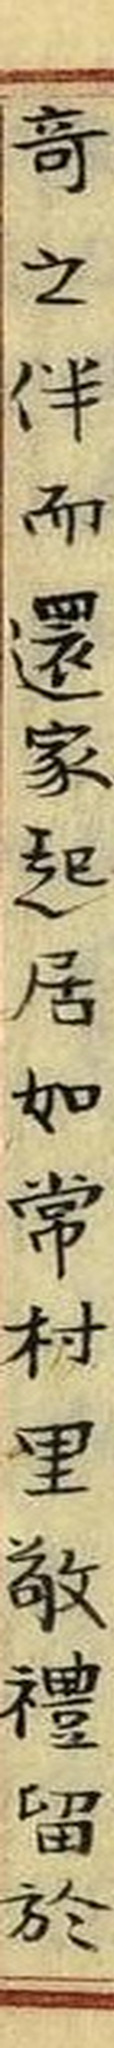竒之伴而還家起居如常村里敬禮留於
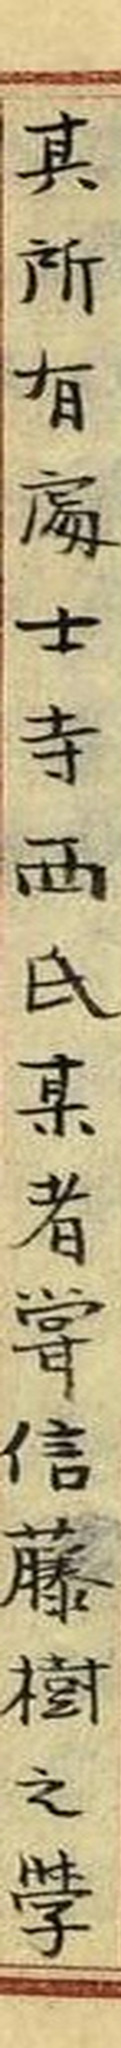其所有䖏士寺西氏某者甞信藤樹之學
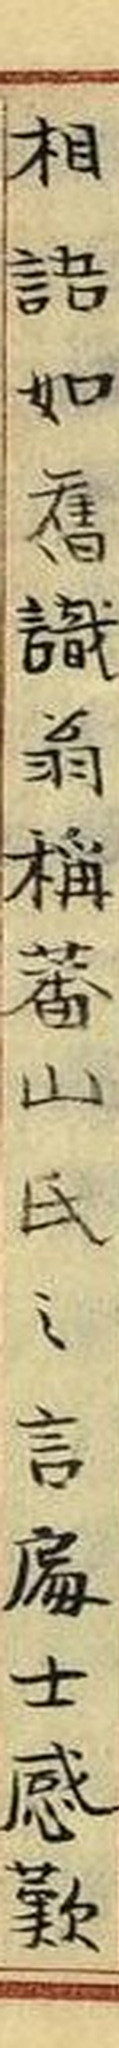相語如𦾔識翁稱蕃山氏之言䖏士感歎
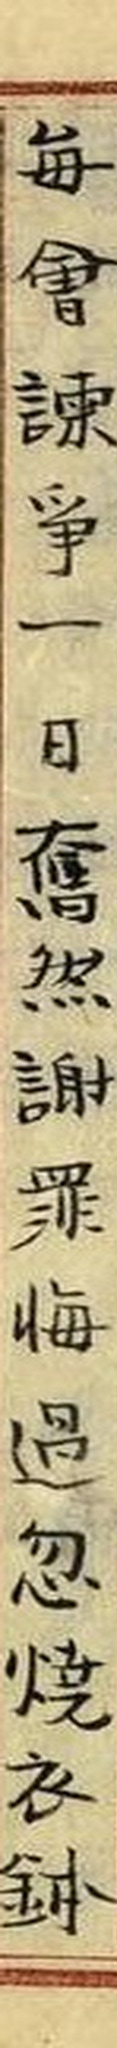毎會諫爭一日奮然謝罪悔過忽焼衣鉢
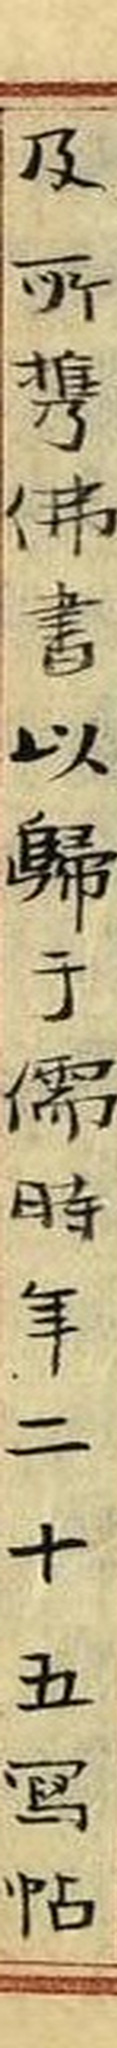及所携佛書以歸于儒時年二十五冩帖
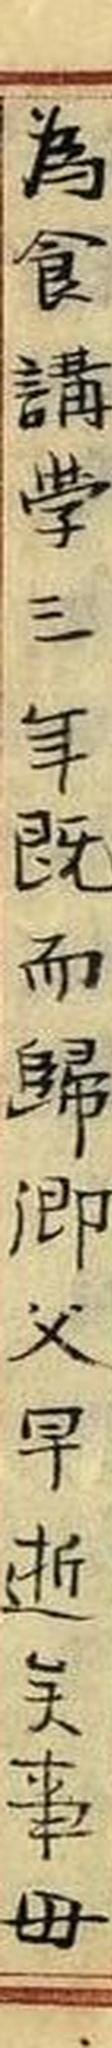為食講學三年既而歸郷父早逝矣事母
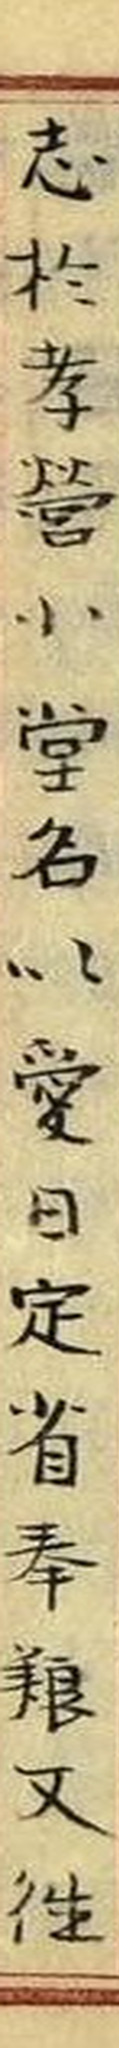志於孝營小堂名以愛日定省奉羪又往
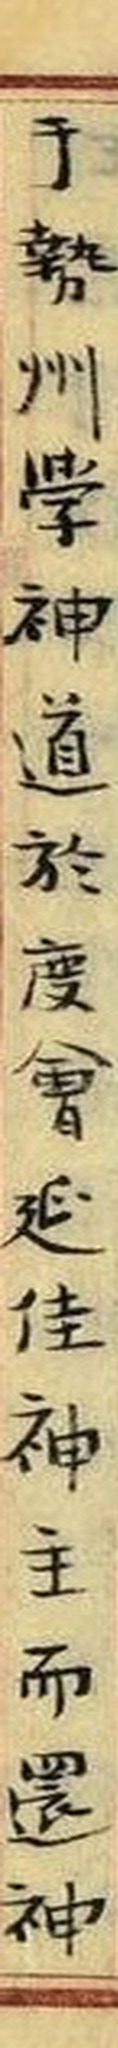于勢州學神道於度會延佳神主而還神

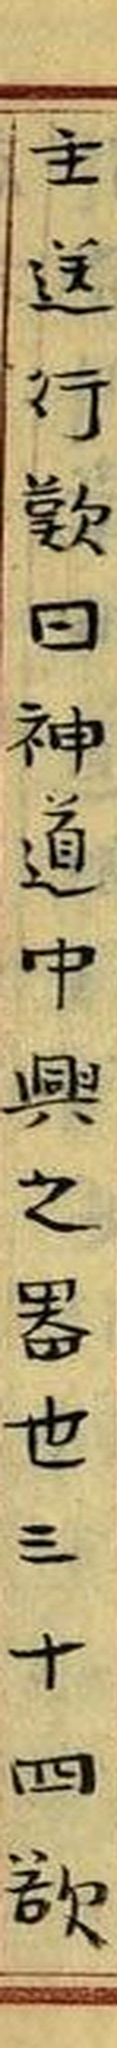主送行歎曰神道中興之器也三十四欲
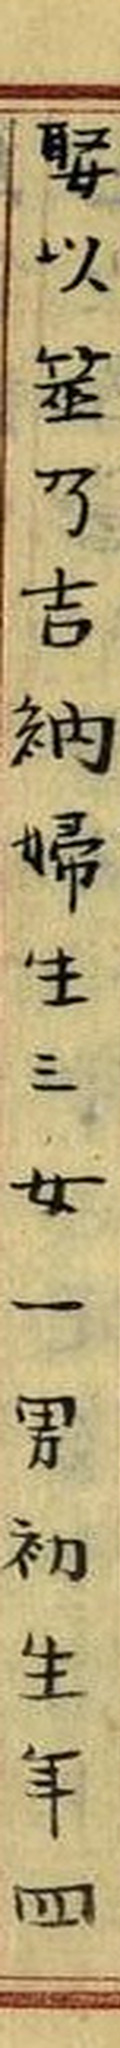娶以筮乃吉納婦生三女一男初生年四
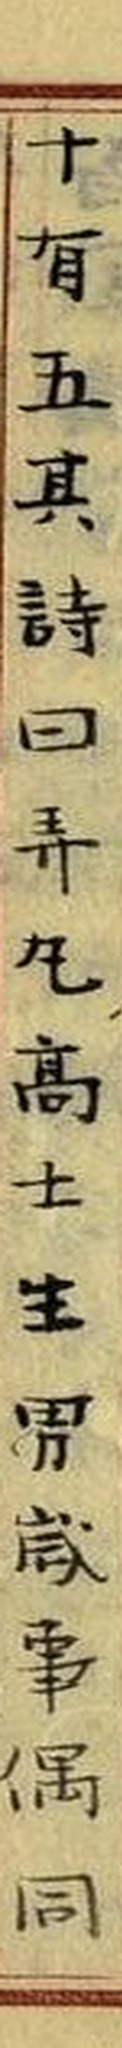十有五其詩曰弄丸髙士生男歳事偶同
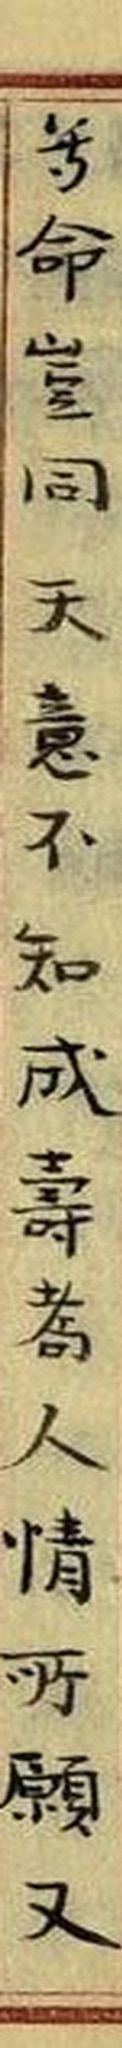号命豈同天意不知成壽耉人情所願又
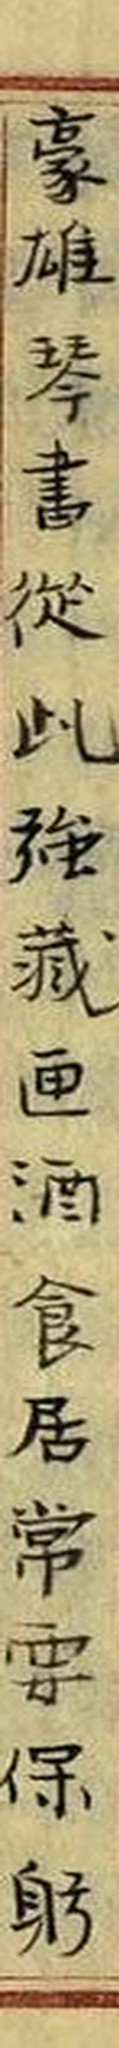豪雄琴書從此強藏匣酒食居常要保躬
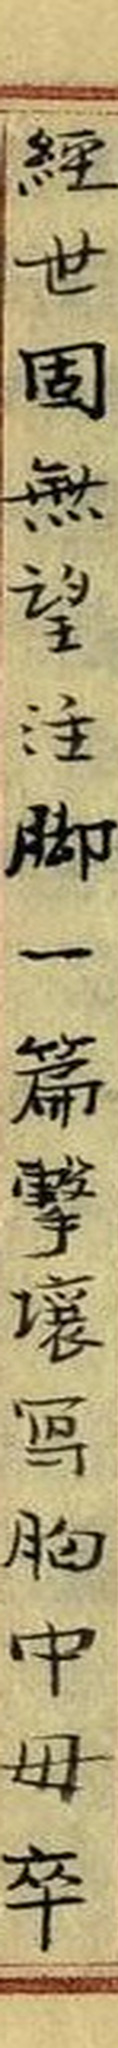經世固無望注脚一篇撃壊冩胸中母卒
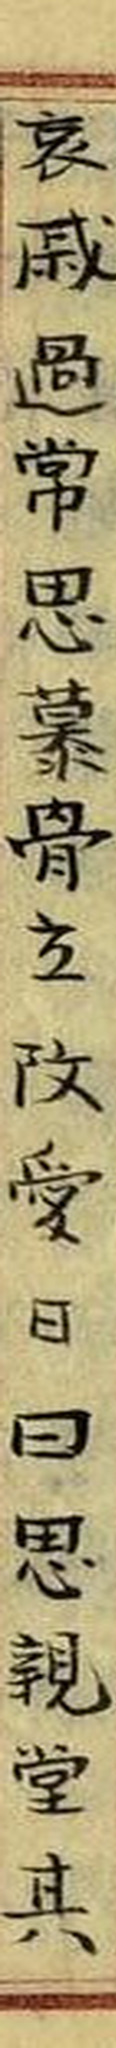哀戚過常思慕骨立𫔻愛日曰思親堂其
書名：温古集 四巻
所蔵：福井県文書館 Fukui Prefectural Archives
